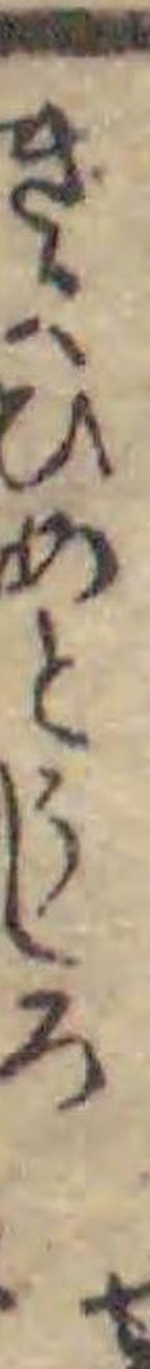きよひめとうしろ
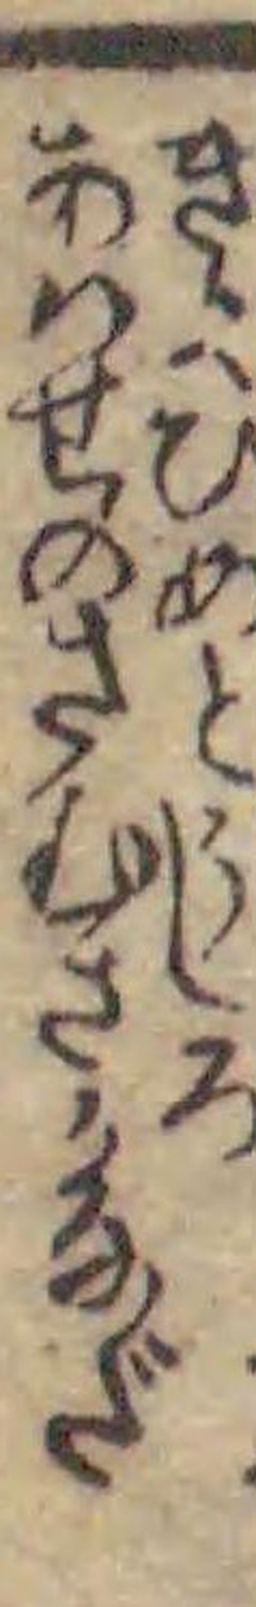あはせのさむさかなだ

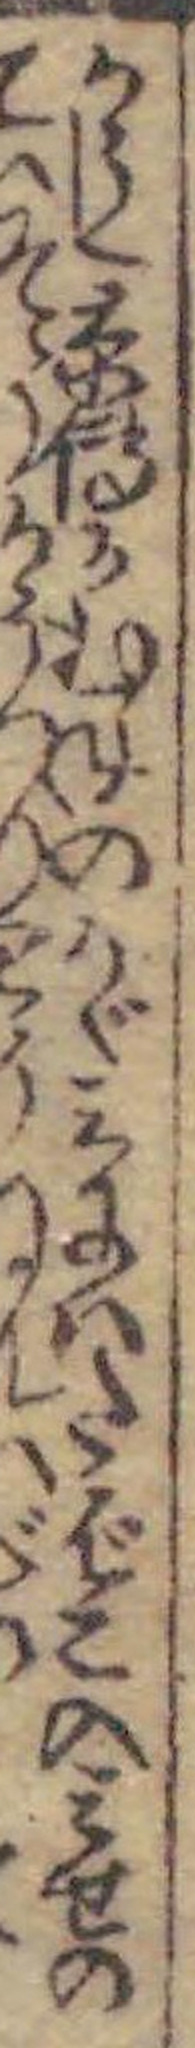かうし京伝がむねのかゞみにはたばこ入みせの
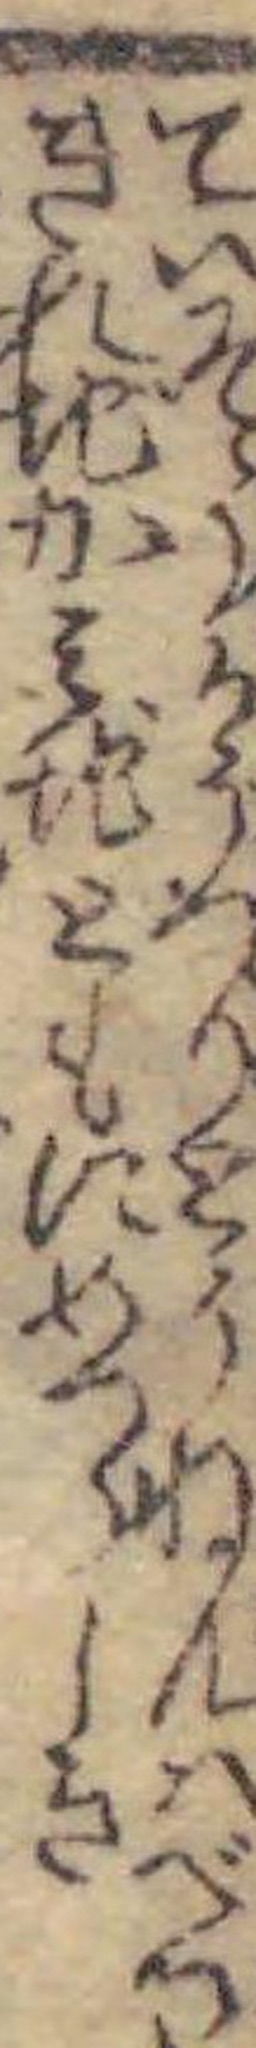きれ地かみ地ともにめつらしき
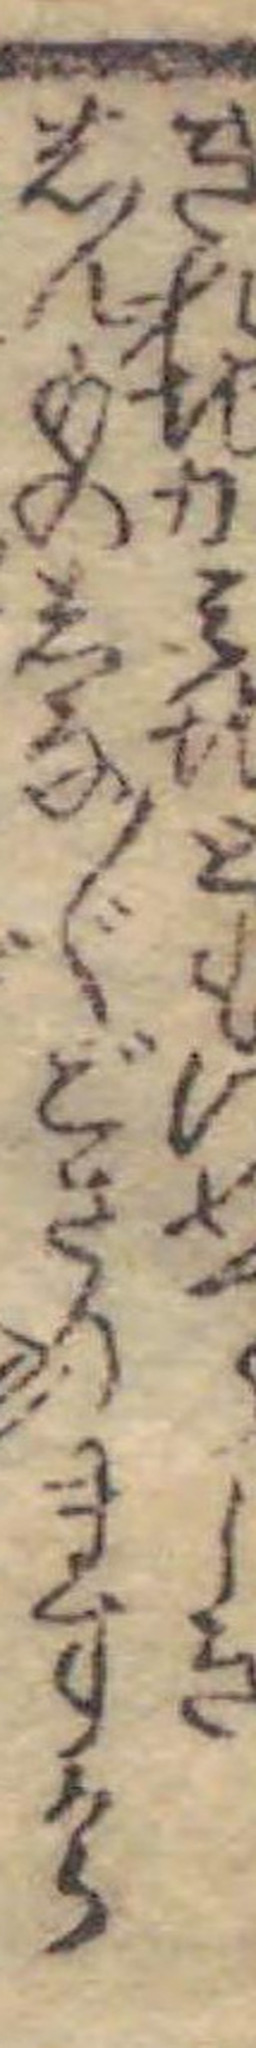しんものしな〴〵ごさりますから
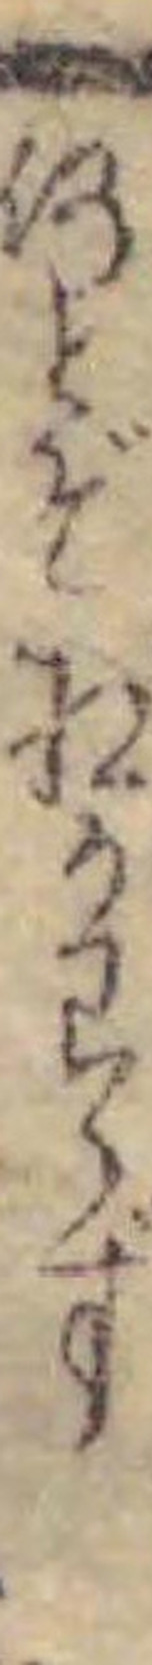何とぞ相かわらず
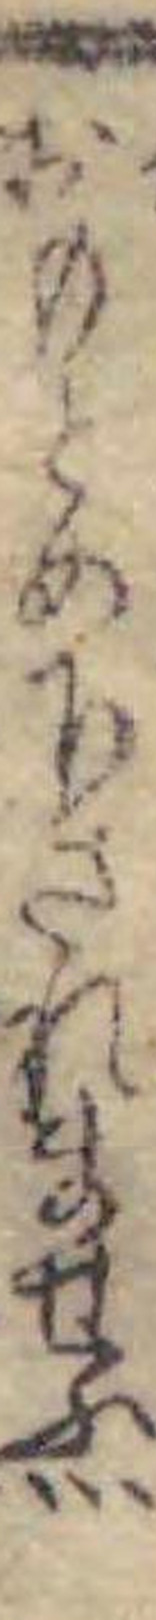おもとめ下されませふ
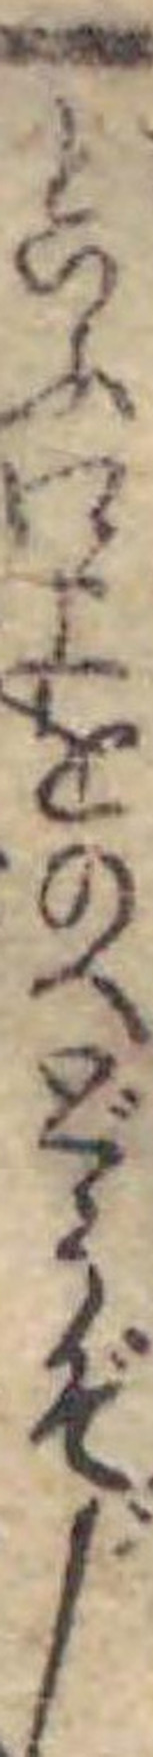といふ口上をのへどうぞ
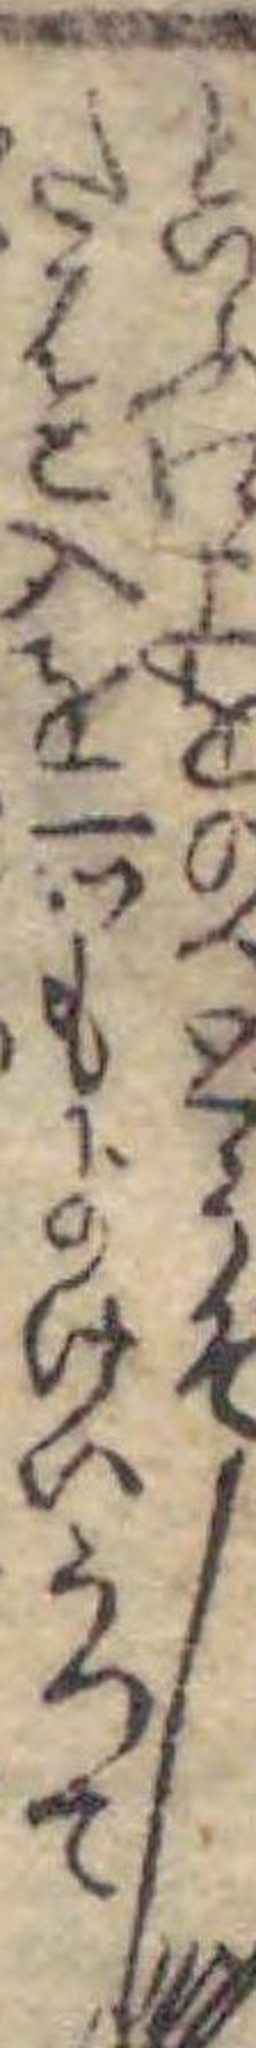たはこ入れを一つもよけいにうつて
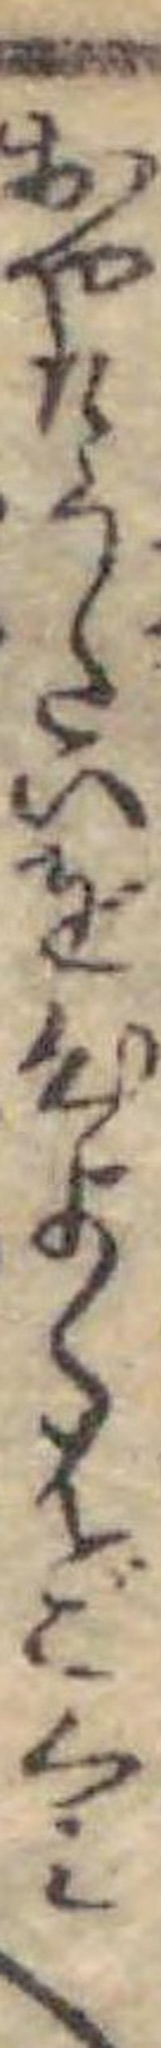おやけうたいを心よくはごくみ
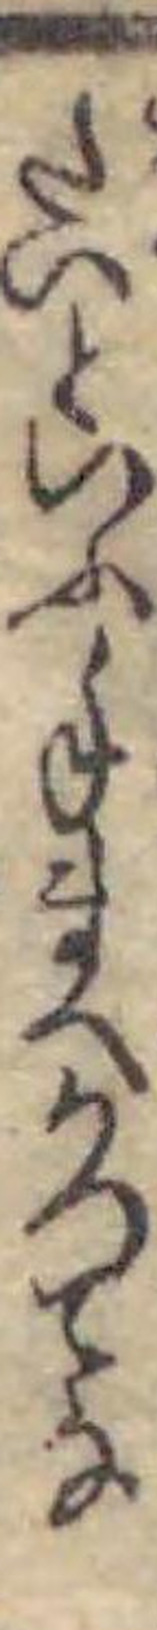たいといふ手まへかつてな
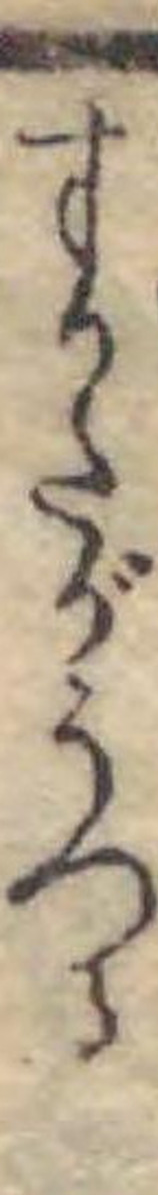すかたがうつる
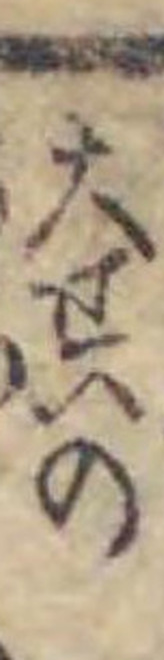大せいの
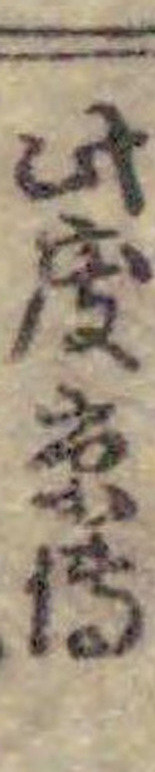今度京伝
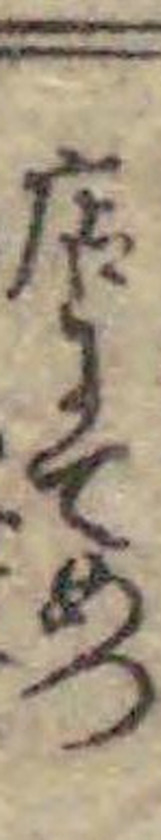店にてめつ
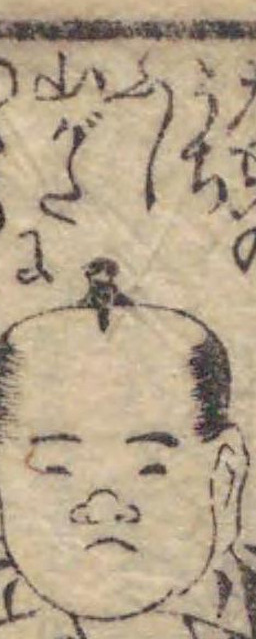山がたに
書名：人心鏡写絵 : 3巻
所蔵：国立国会図書館 National Diet Library, JAPAN
